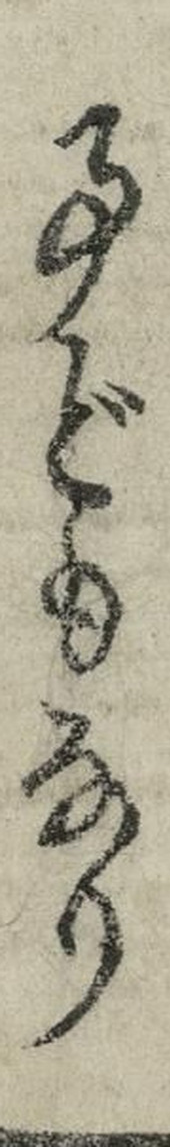事どもなり
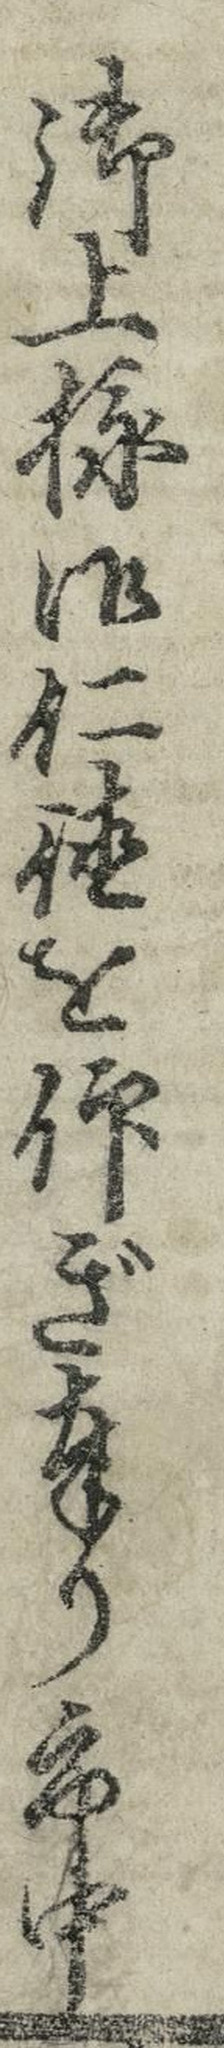御用御上様御仁徳を仰ぎ奉り市中
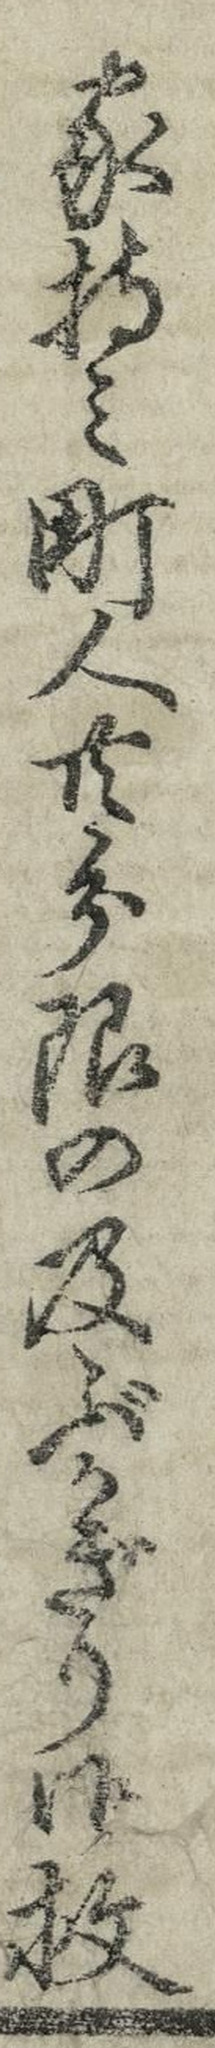家持之町人共分限の及ぶかぎり御救
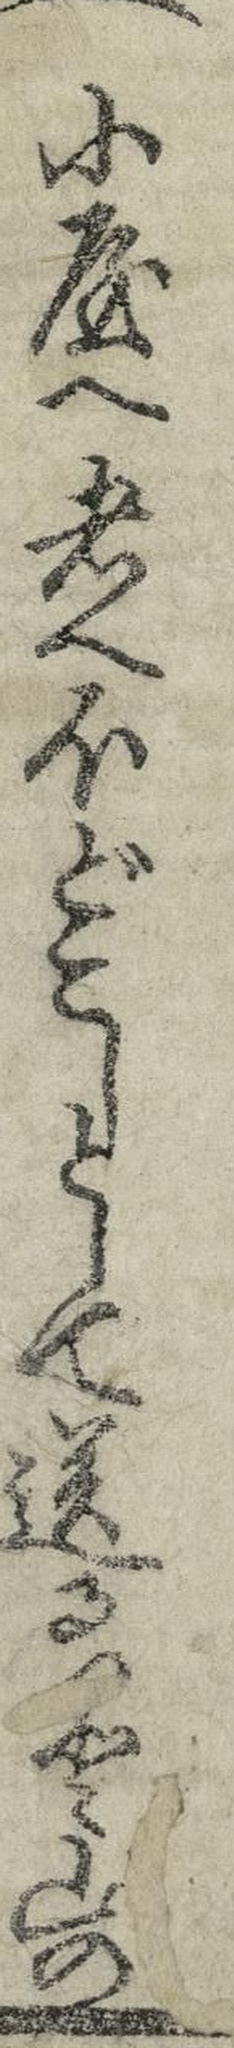御用小屋へ者へほどこしとして送る品々山の
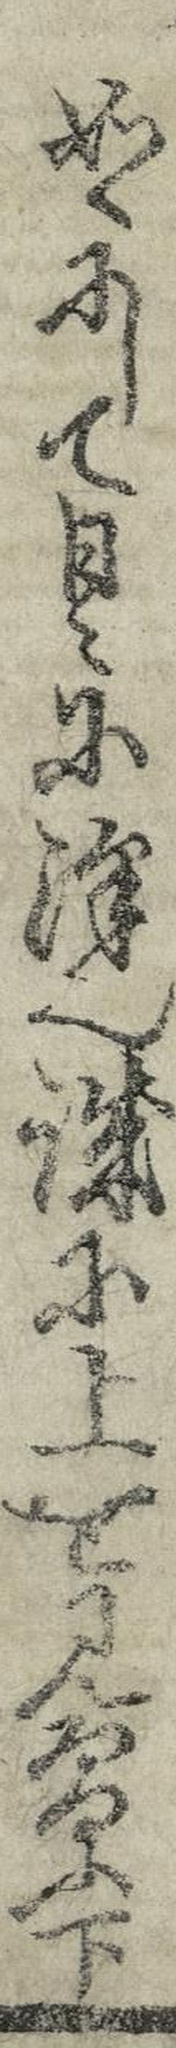町会所如くにして日々に沢也誠に上を見習ふ下
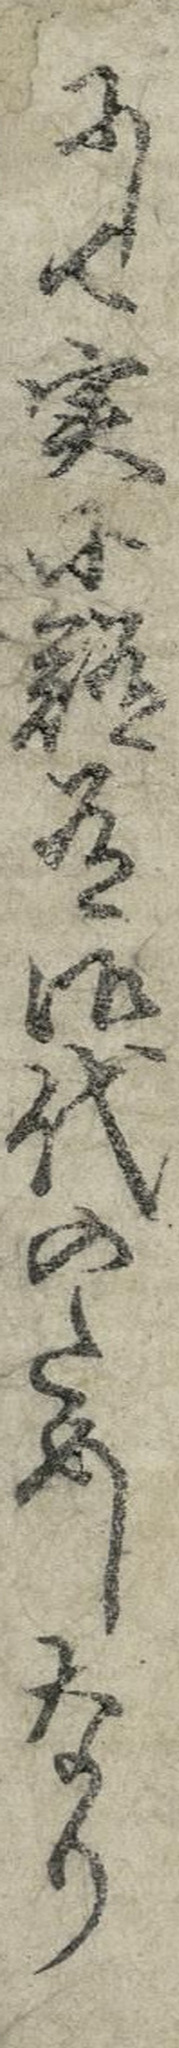御用にして実に難有御代のためしなり
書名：江戸　大地震末代噺の種　全
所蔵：東京大学地震研究所図書室 Earthquake Research Institute Library, The University of Tokyo, JAPAN
